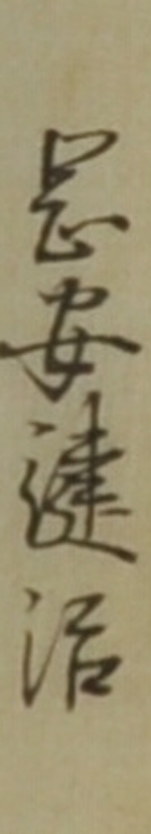岡安健治
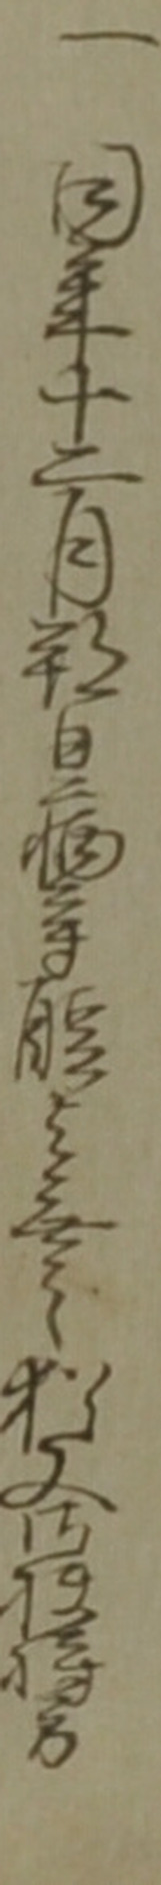一同年十二月朔日病気聢与無之猶又御扶持方
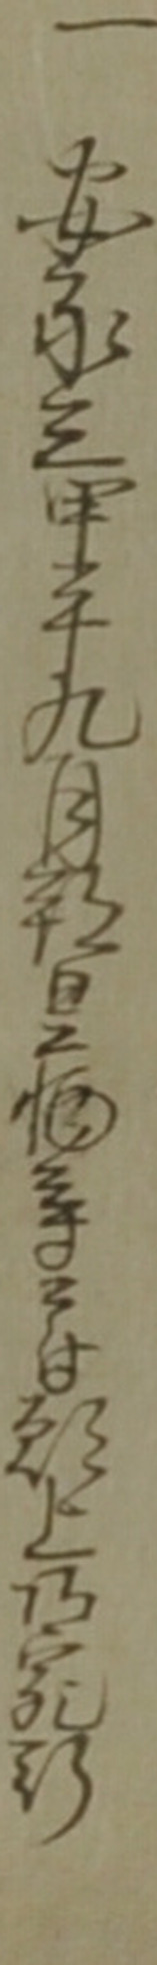一安永三甲午九月朔日病気ニ付願上御宛行
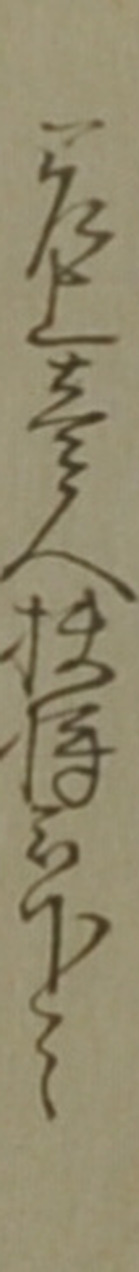差上壱人扶持被下之
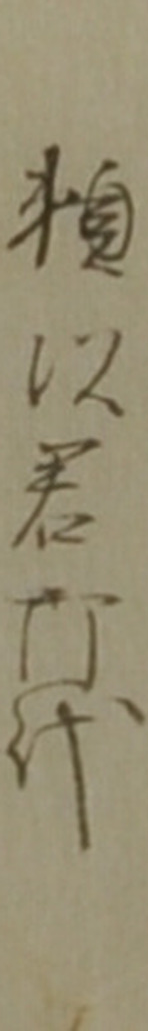頼以君御代
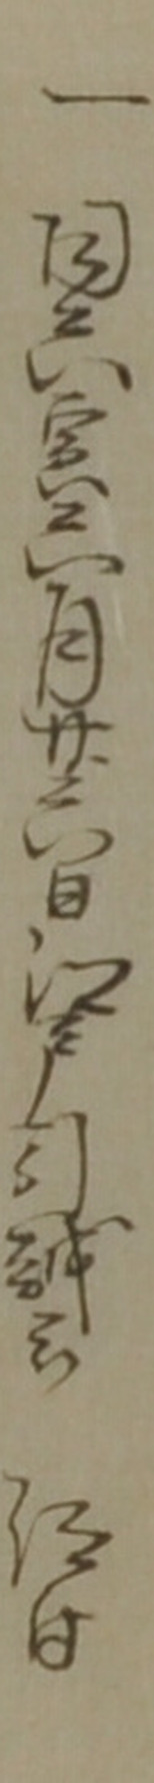一同六寅六月廿六日江戸引越被仰付
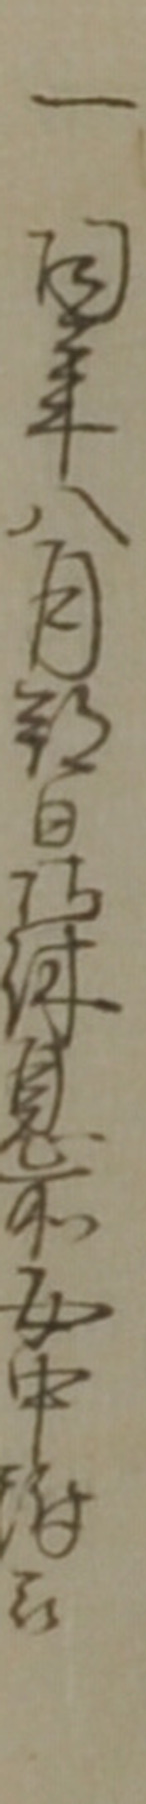一同年八月朔日御休息所女中附被
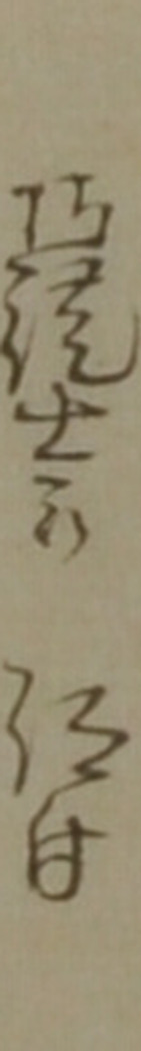御徒士被仰付
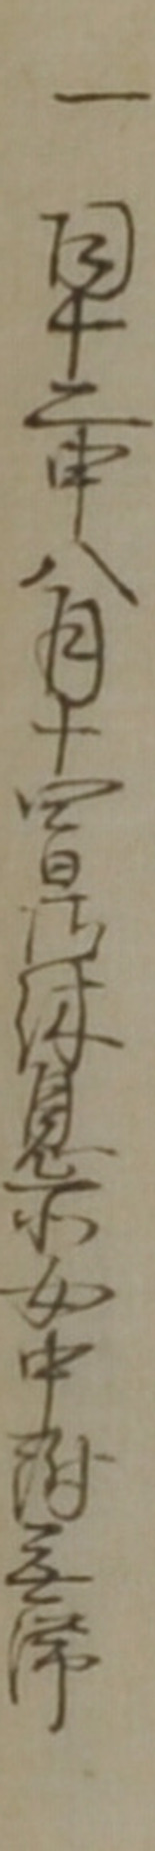一同十二申八月十四日御休息所女中附無滞
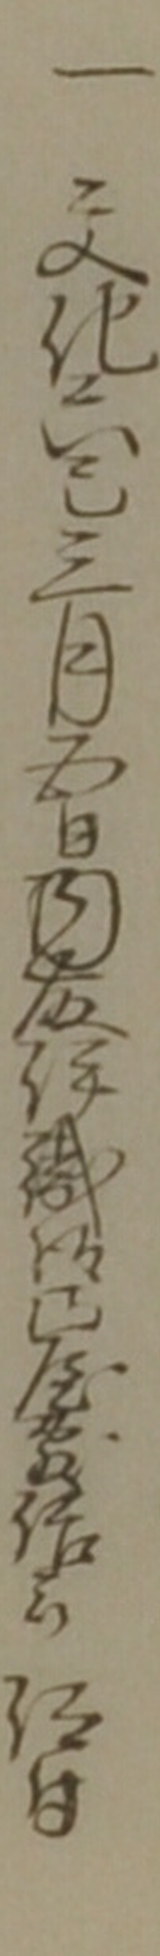一文化六巳三月五日内藤伊織様御屋敷詰被仰付
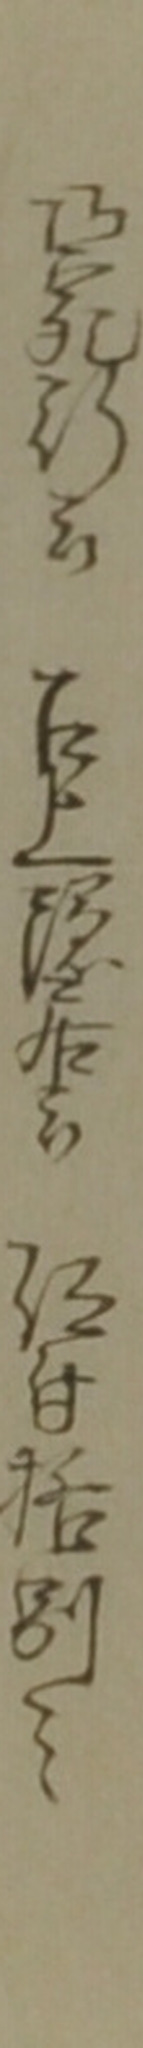御宛行被召上隠居被仰付格別之
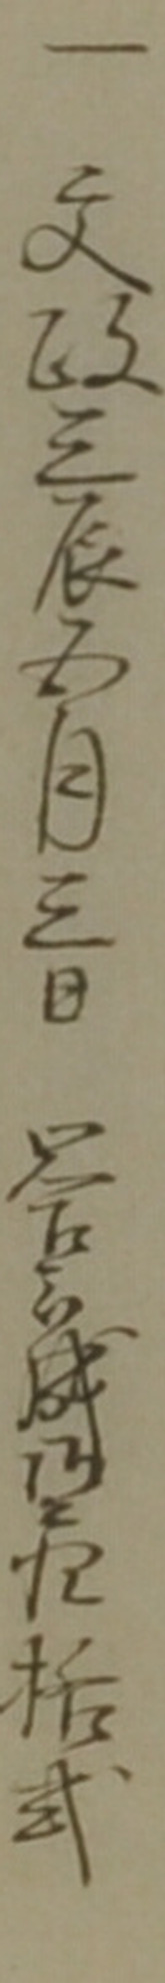一文政三辰五月三日思召被成御座格式
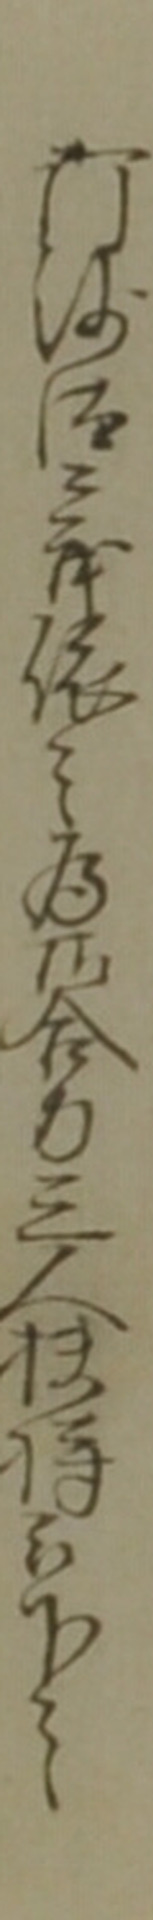御沙汰ニ茂依之為御合力三人扶持被下之
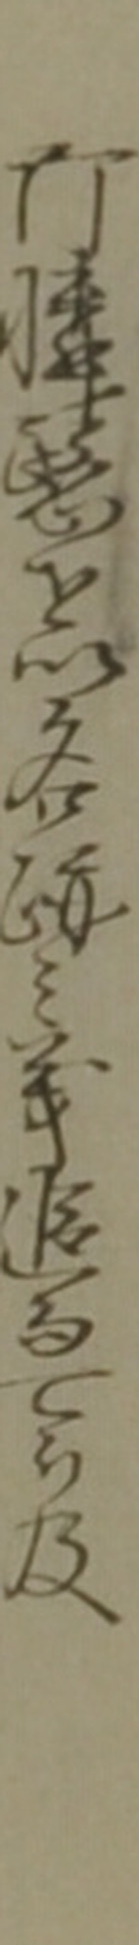御憐愍を以名跡之義追而可被及
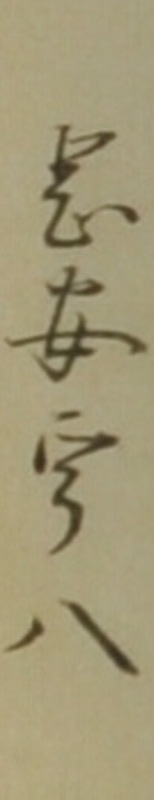岡安宇八

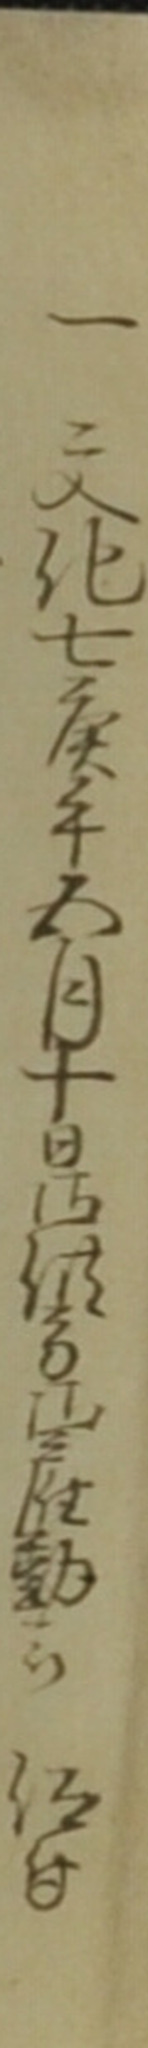一文化七庚午五月十日御供方御雇勤被仰付
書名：無足廃家（壱）
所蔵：伊那市立高遠町図書館・合同会社AMANE
